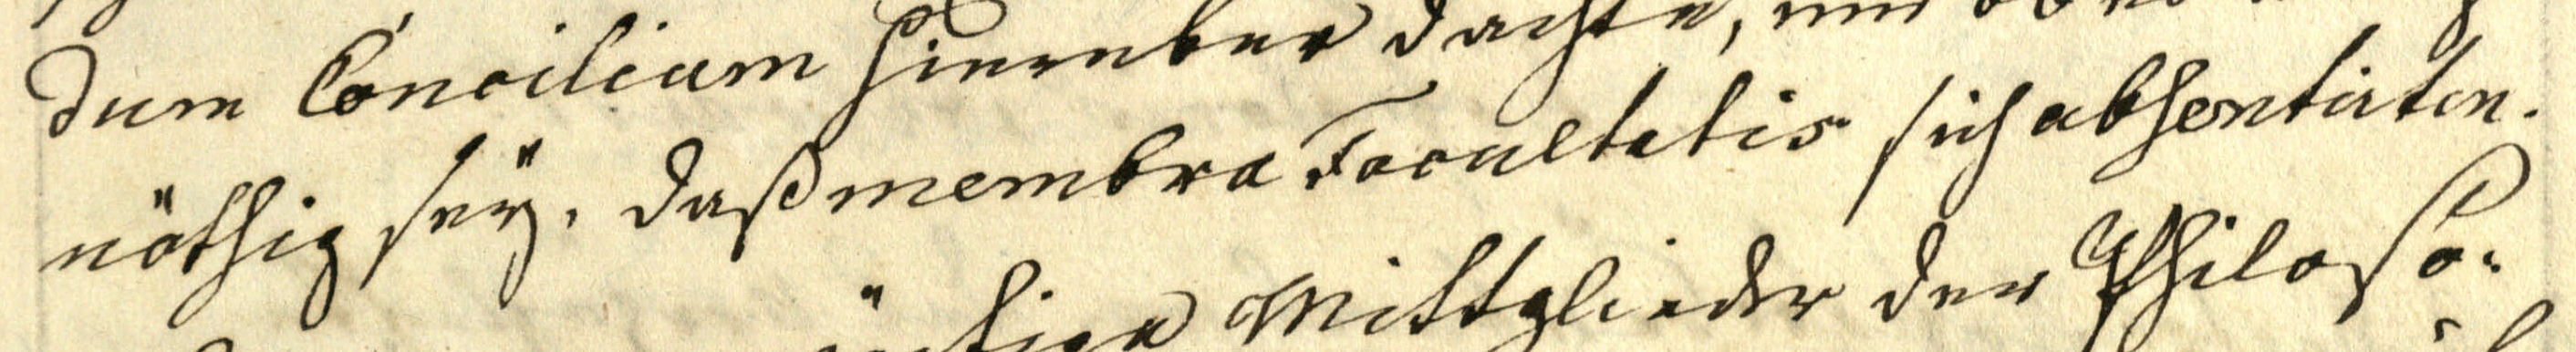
nöthig seÿ, daß membra Facultatis sich absentirten.
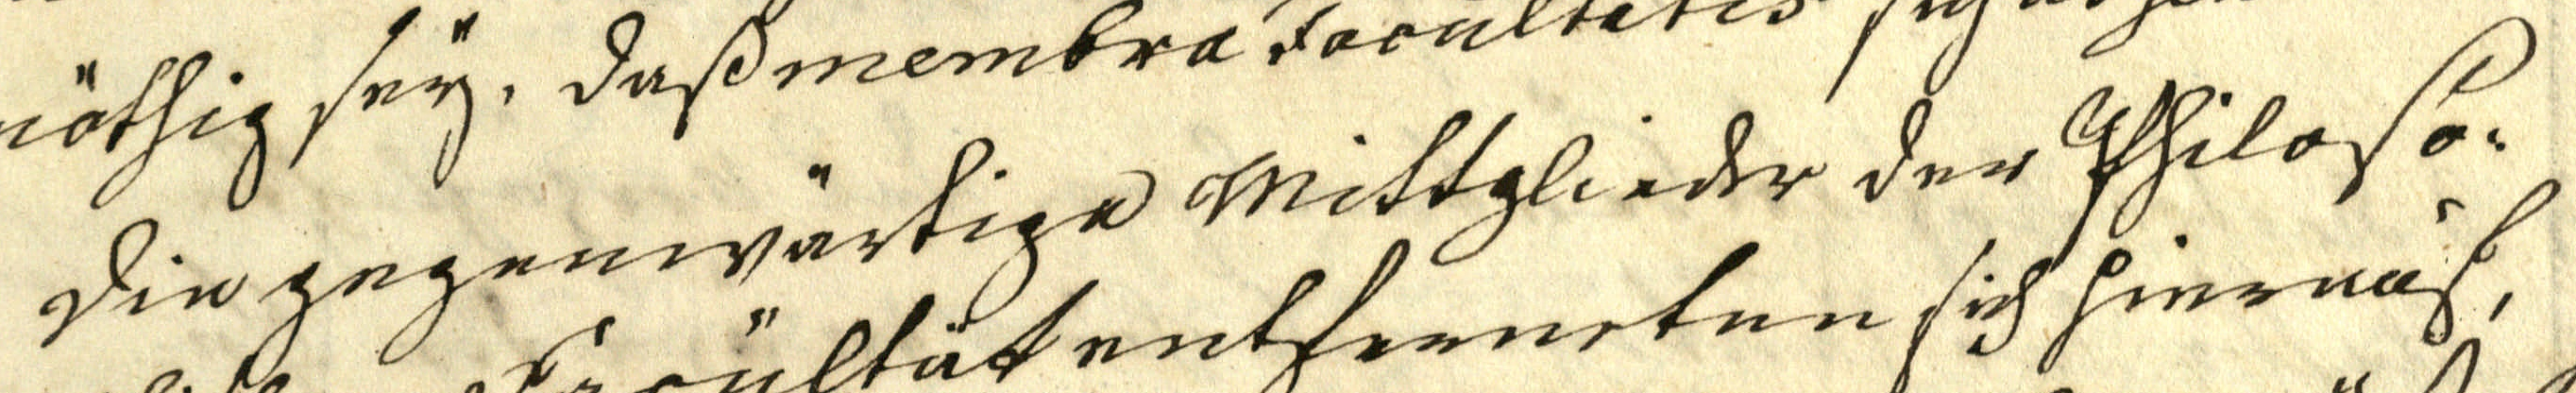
Die gegenwärtige Mittglieder der Philoso¬
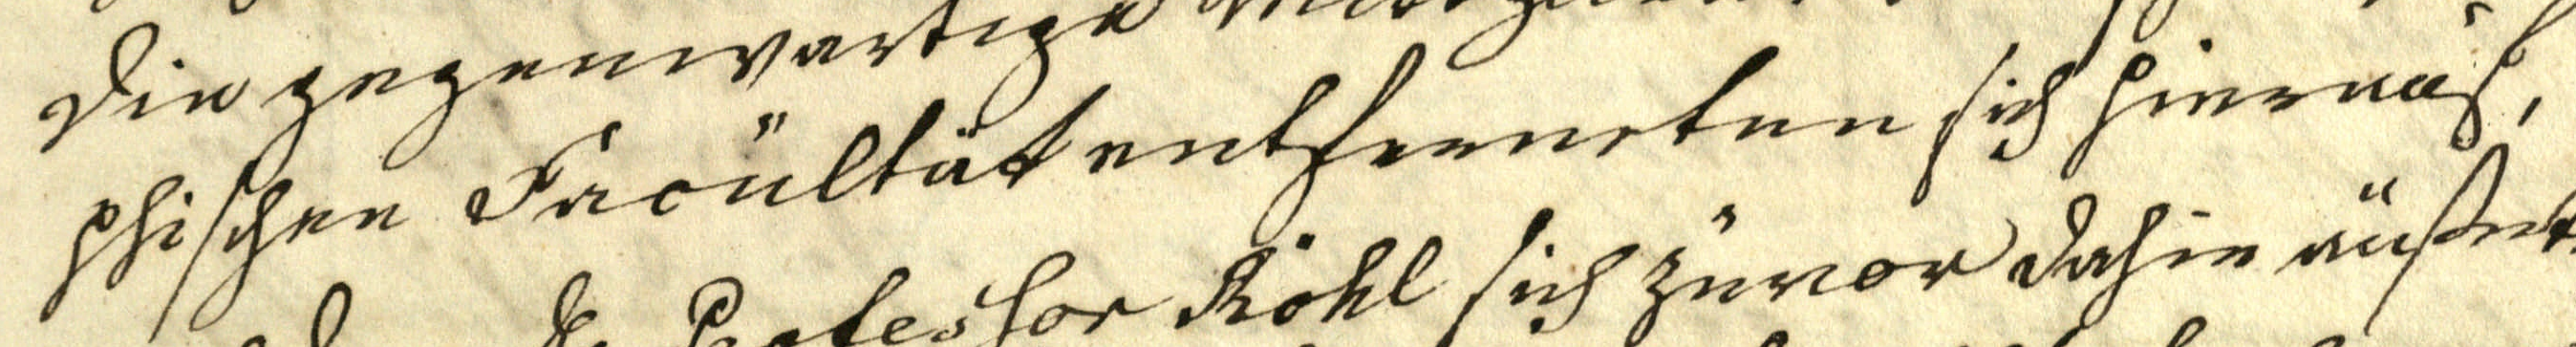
phischen Facultät entferneten sich hierauf,
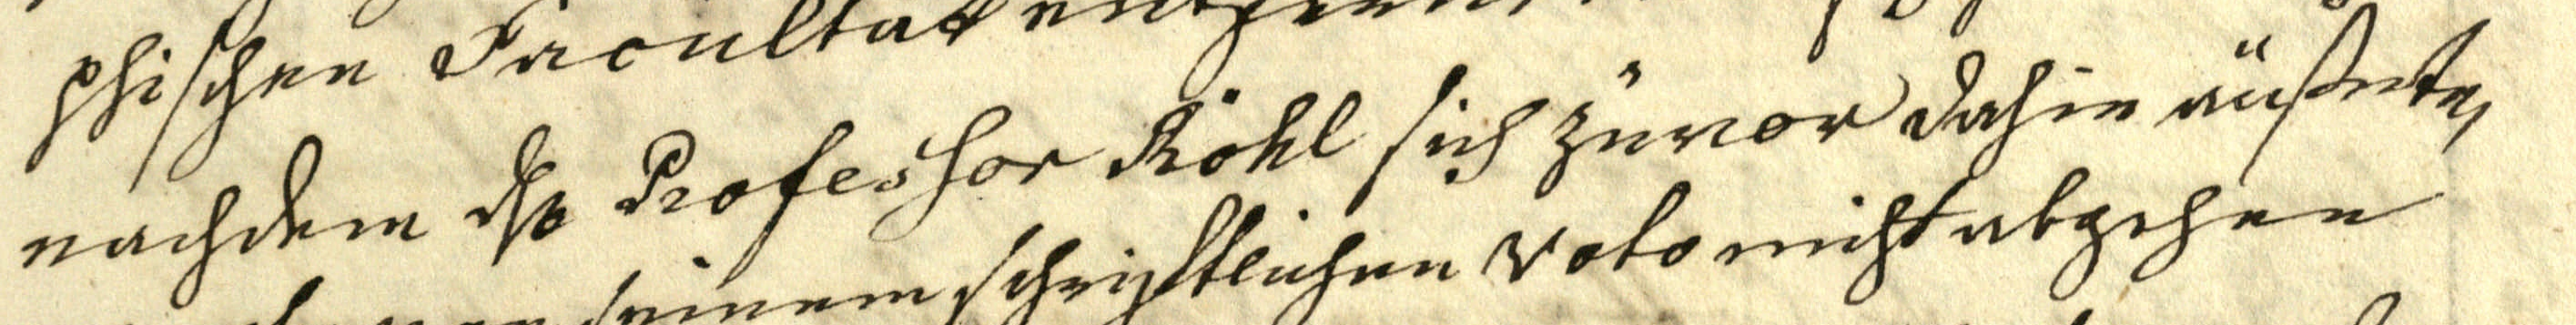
nachdem dh Professor Röhl sich zuvor dahin äußerte,
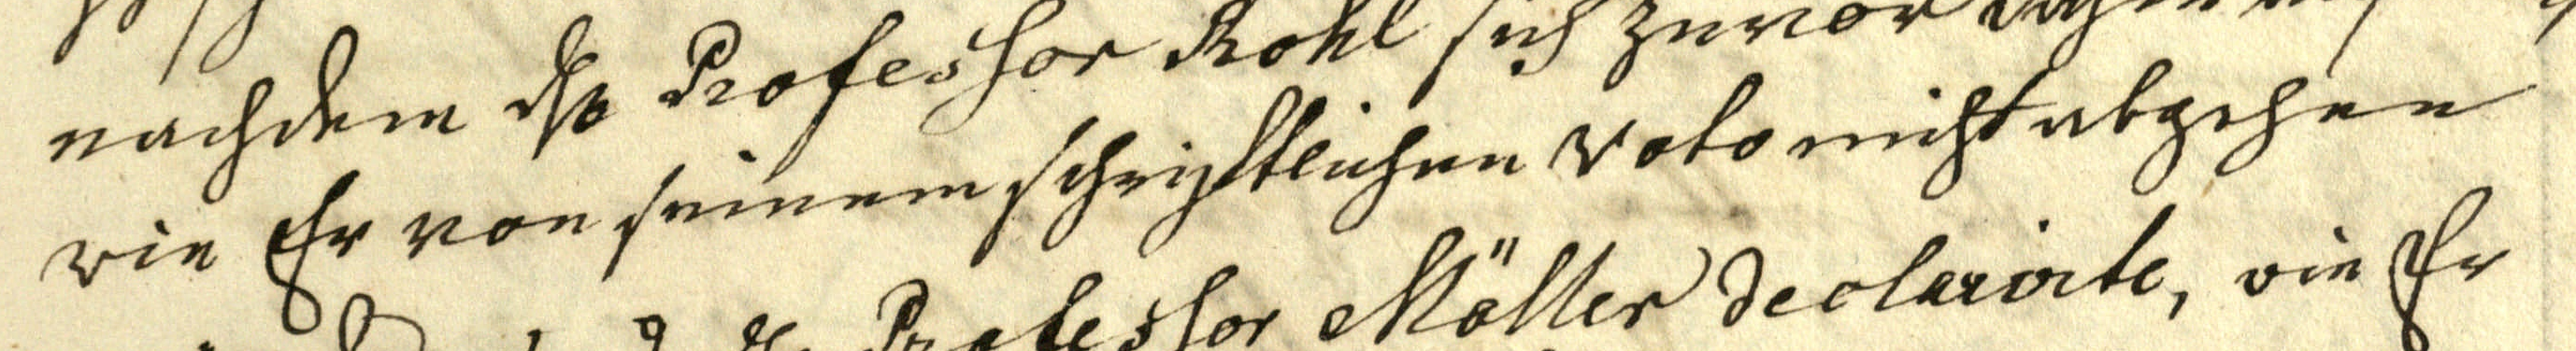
wie Er von seinem schriftlichen voto nicht abgehen
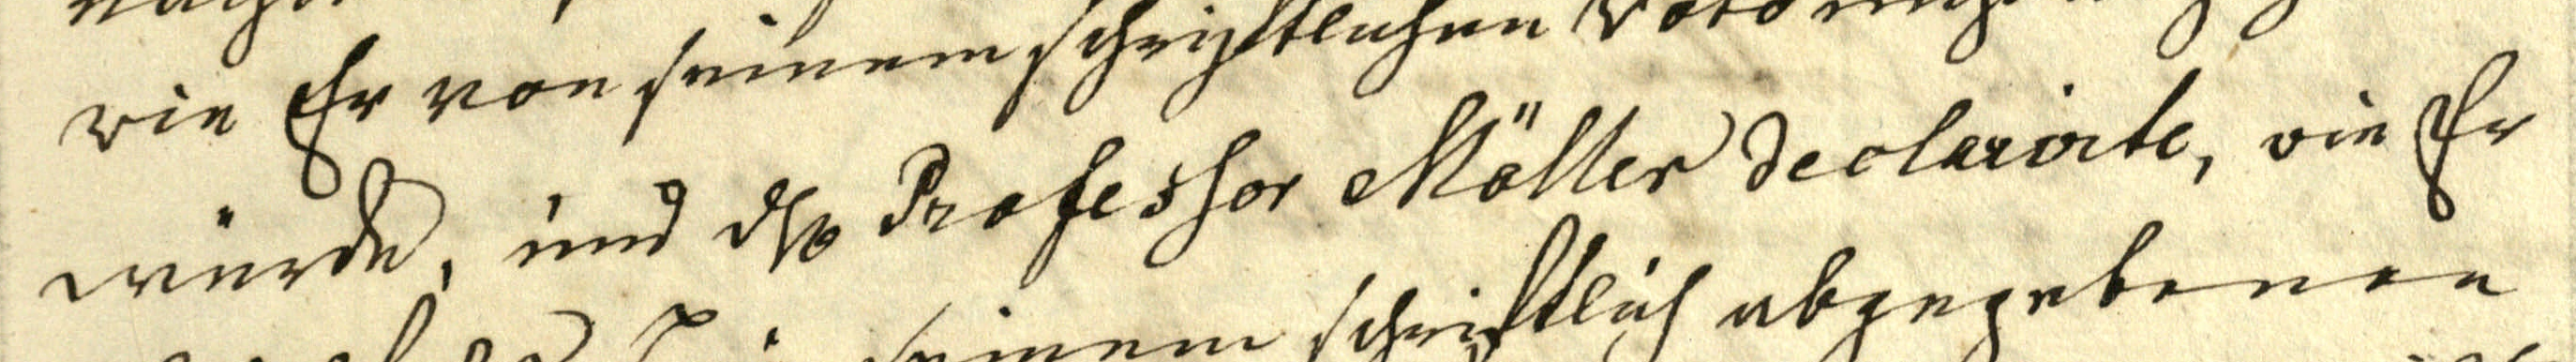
würde, und dh Professor Möller declarirte, wie Er
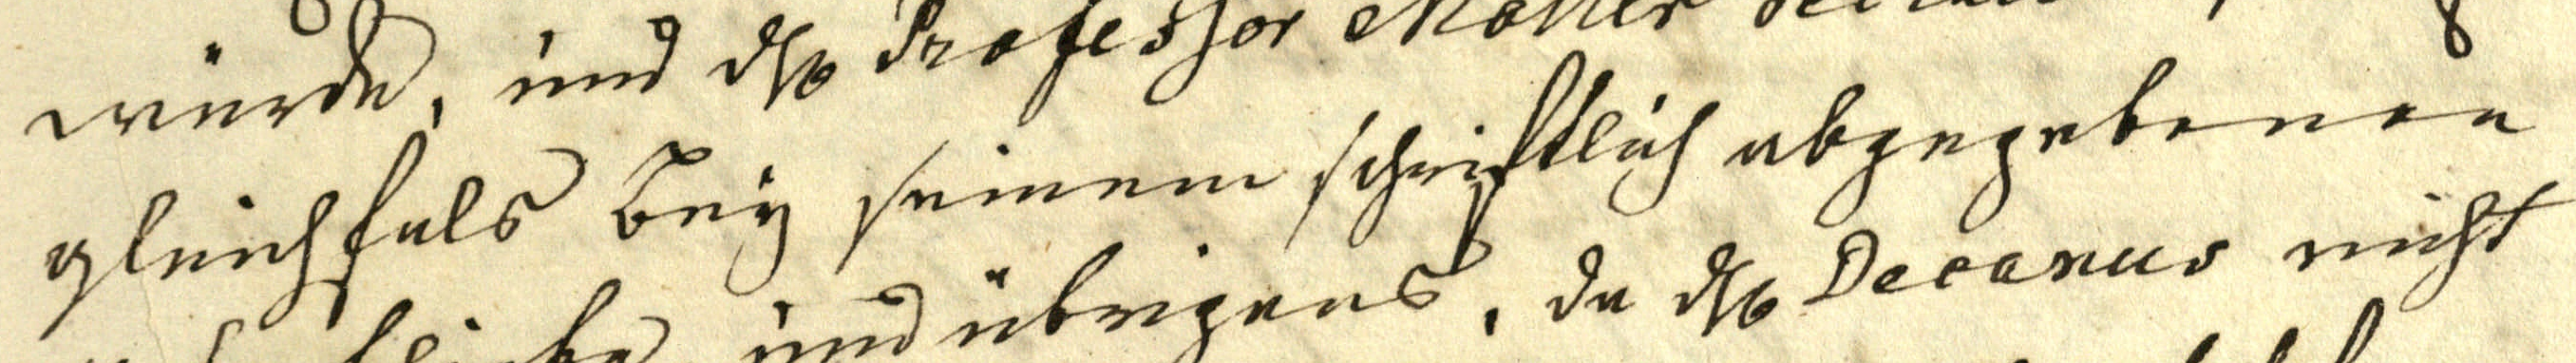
gleichfals beÿ seinem schriftlich abgegebenen
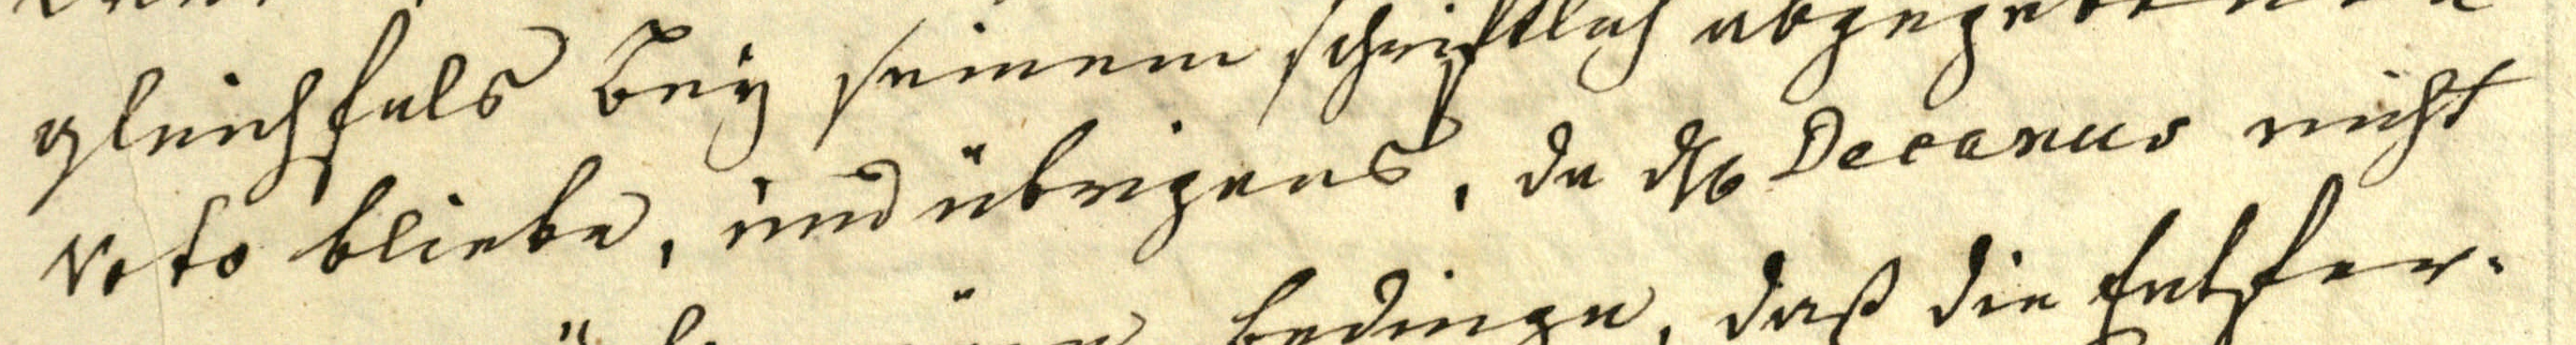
voto bliebe, und übrigens, da dh Decanus nicht
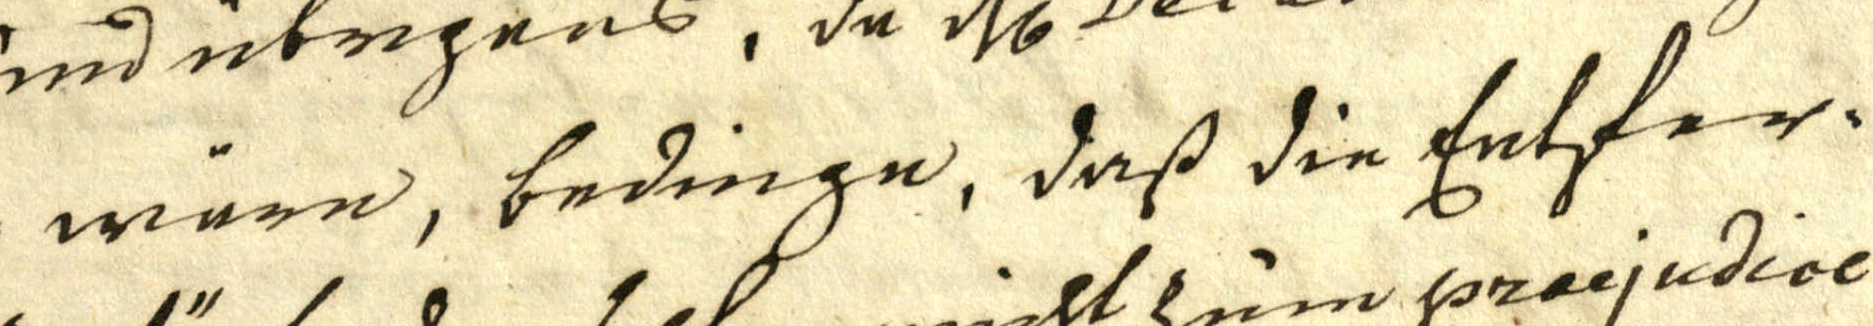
gegenwärtig wäre, bedinge, daß die Entfer¬
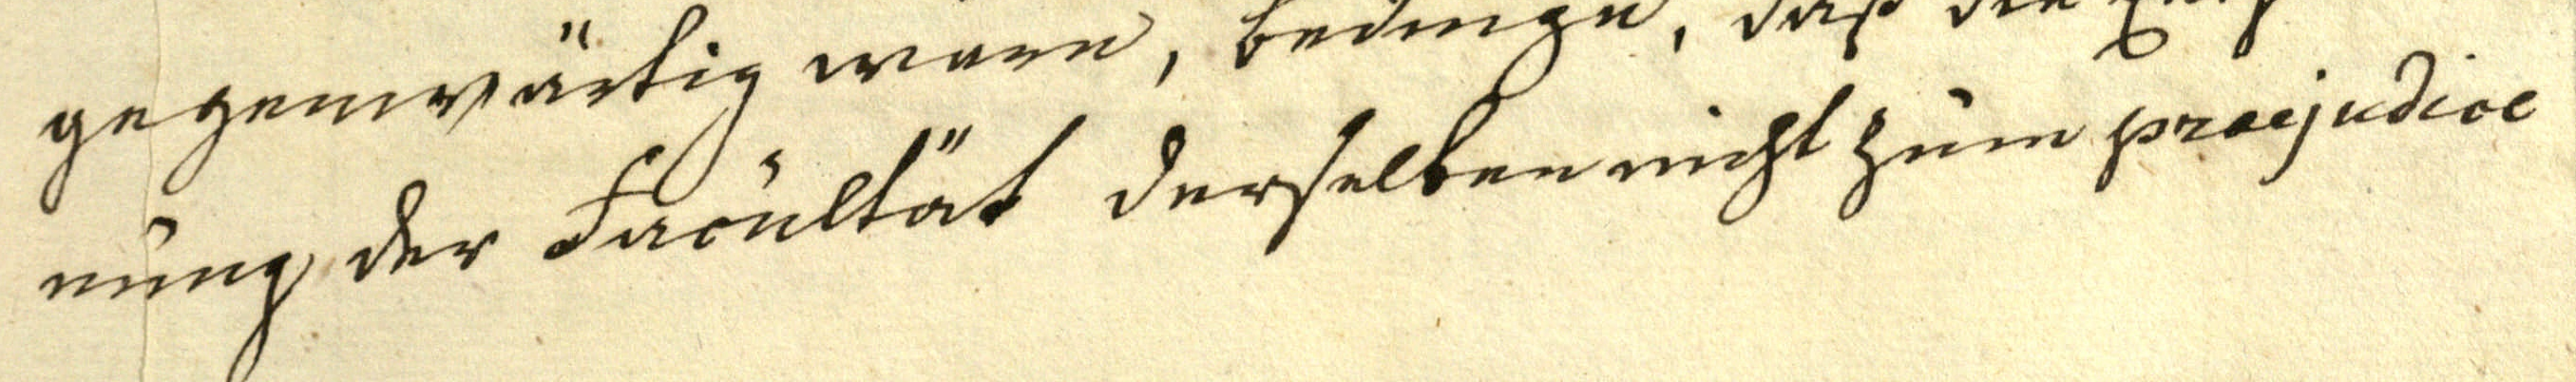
nung der Facultät derselben nicht zum praejudice
